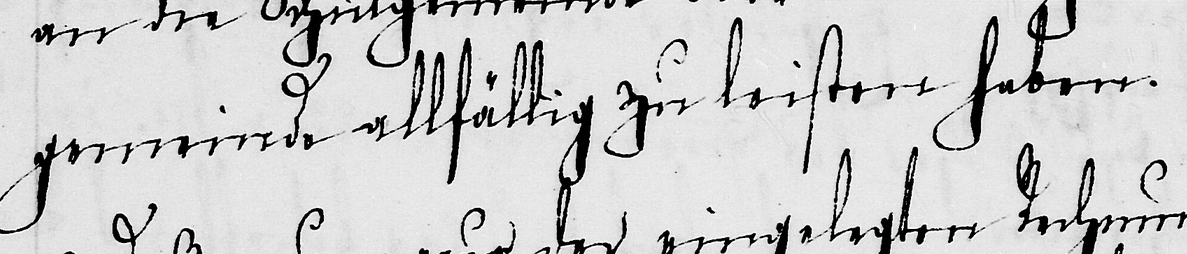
gemeinde allfällig zu leisten haben.
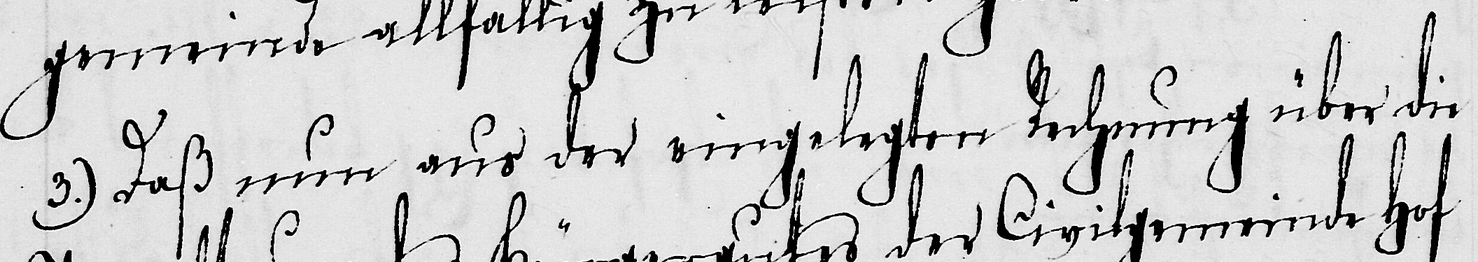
3.) Daß nun aus der eingelegten Rechnung über die
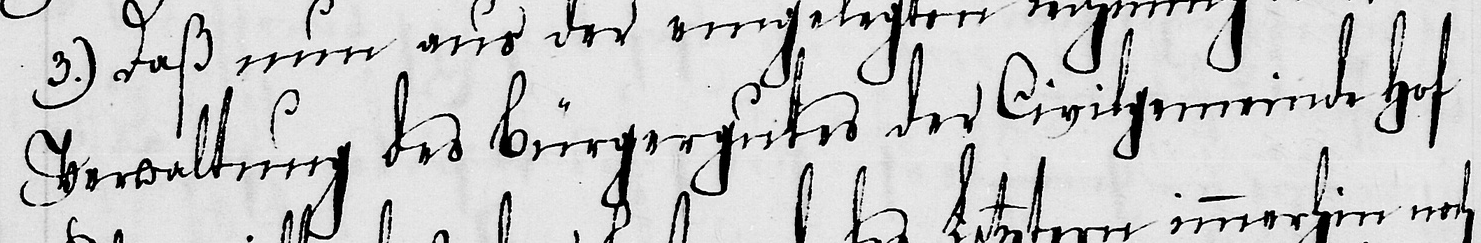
Verwaltung des Bürgergutes der Civilgemeinde Hof
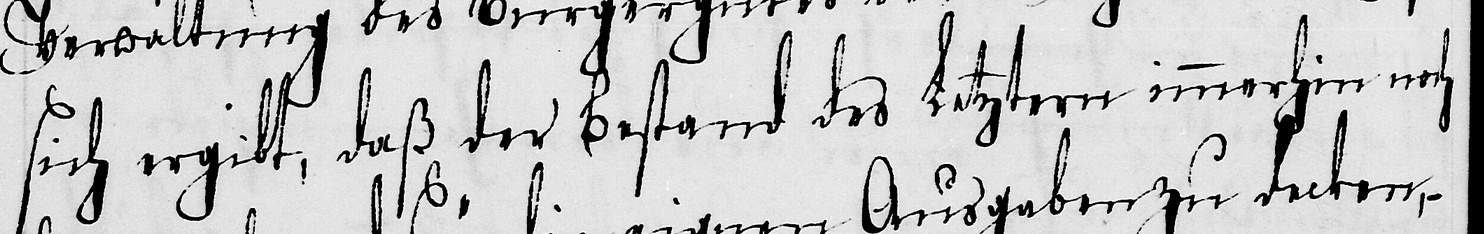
sich ergibt, daß der Bestand des Letztern immerhin noch
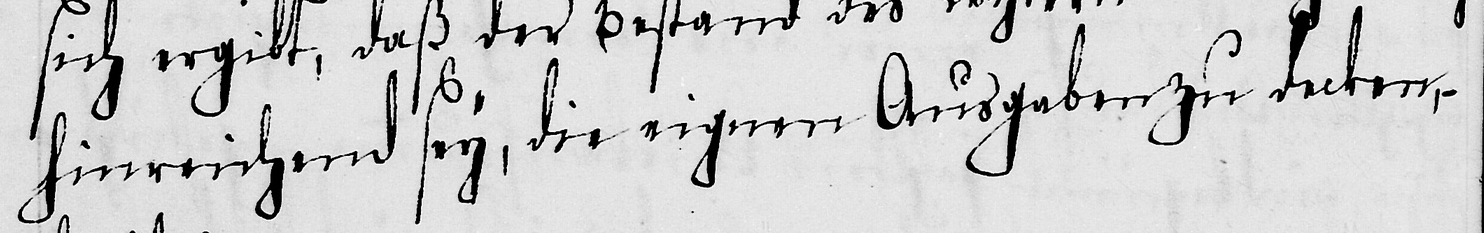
hinreichend sey, die eignen Ausgaben zu decken,
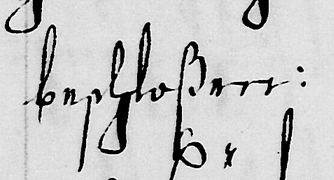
beschloßen:
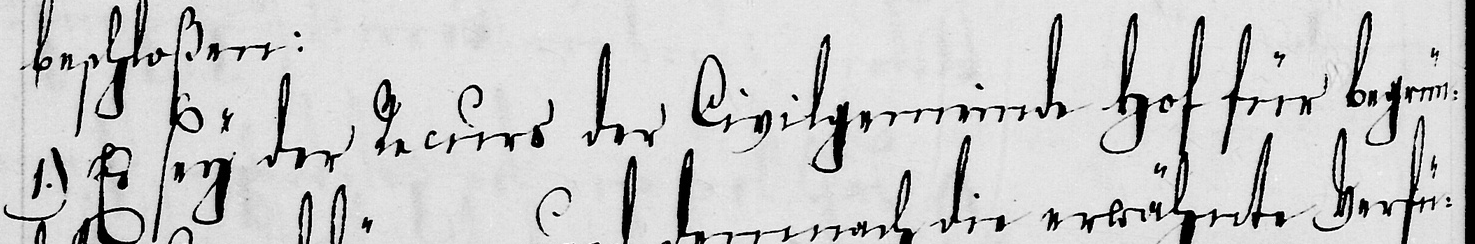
Es sey der Recurs der Civilgemeinde Hof für begr¬
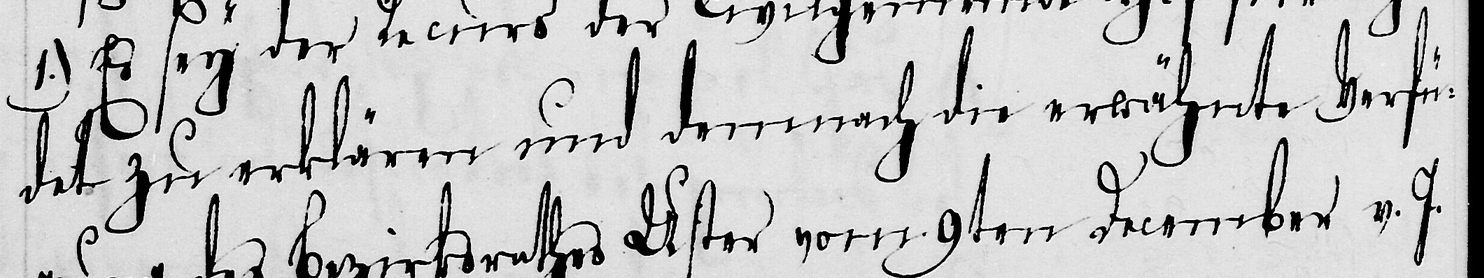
det zu erklären und demnach die erwähnte Verfü¬
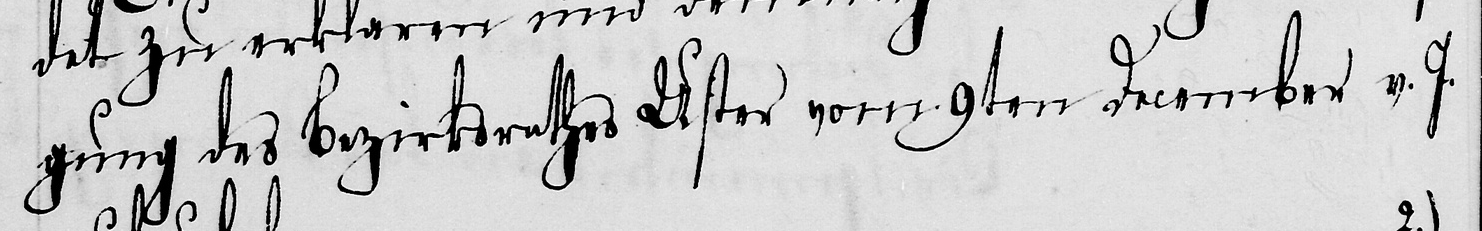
gung des Bezirksrathes Uster vom 9ten December v. J.
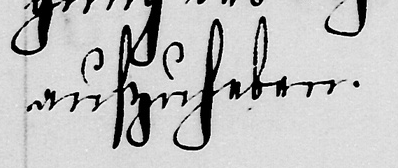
aufzuheben.
